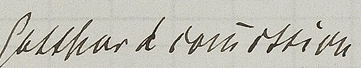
Gotthardcommission
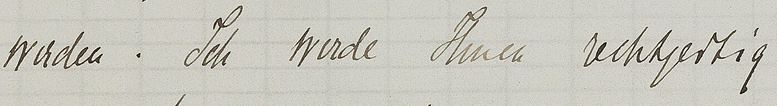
werden. Ich werde Ihnen rechtzeitig
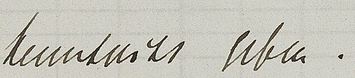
Kenntniss geben.
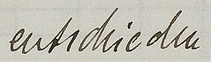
entschieden
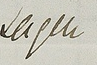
besser.
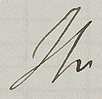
Bern
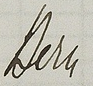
den
